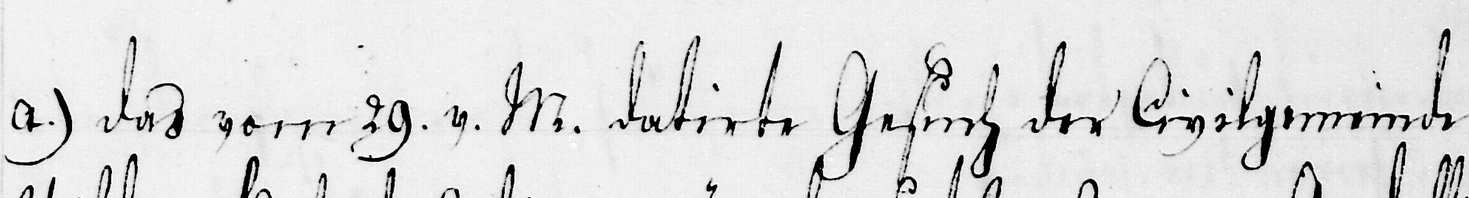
a.) das vom 29. v. M. datirte Gesuch der Civilgemeinde
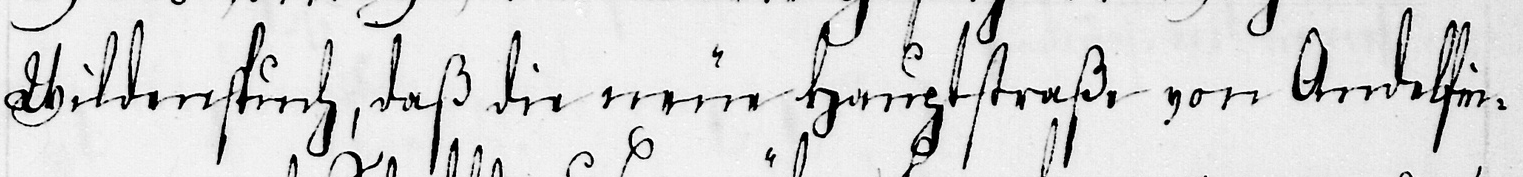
Wildenspuch, daß die neue Hauptstraße von Andelfin¬
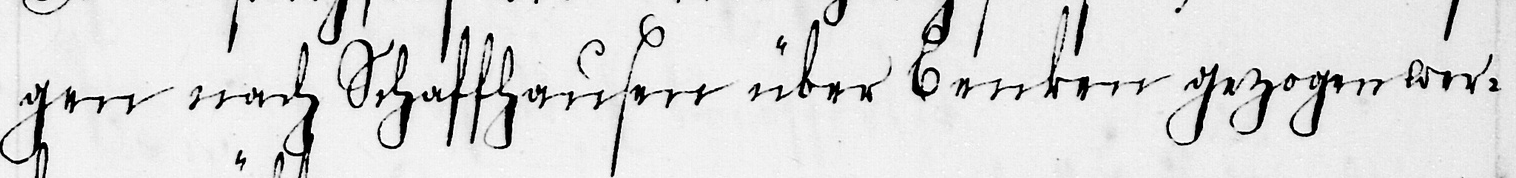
gen nach Schaffhausen über Benken gezogen wer¬
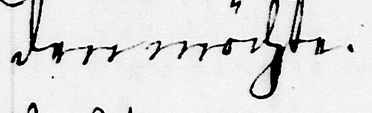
den möchte.
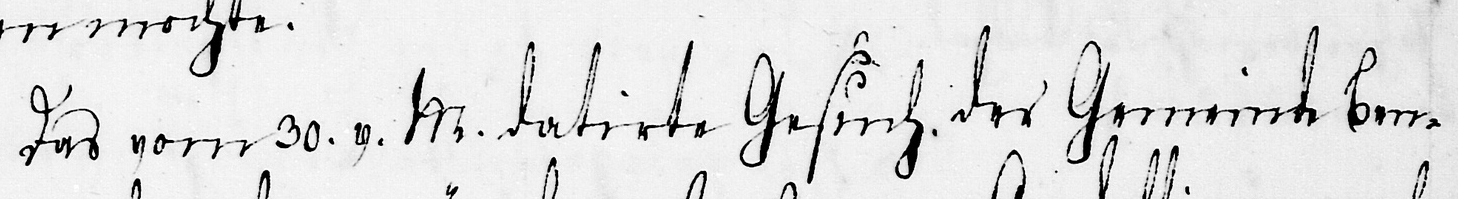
Das vom 30. v. M. datirte Gesuch der Gemeinde Ben¬
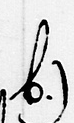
be¬
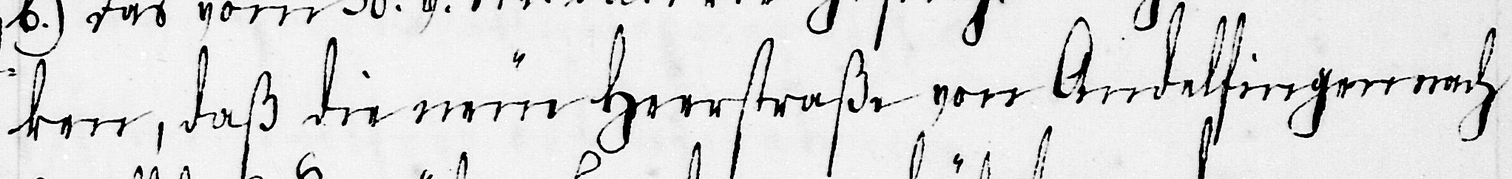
ken, daß die neue Heerstraße von Andelfingen nach
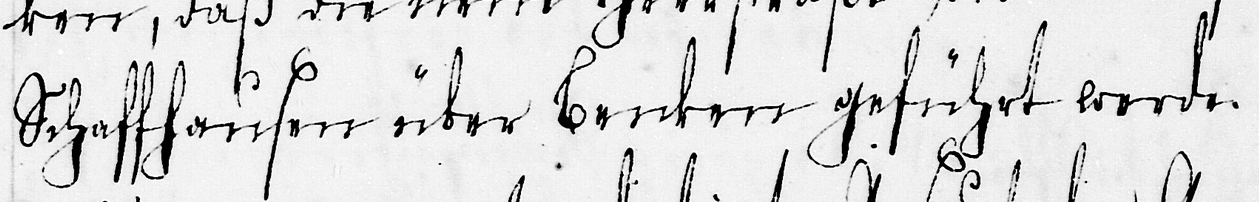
Schaffhausen über Benken geführt werde.
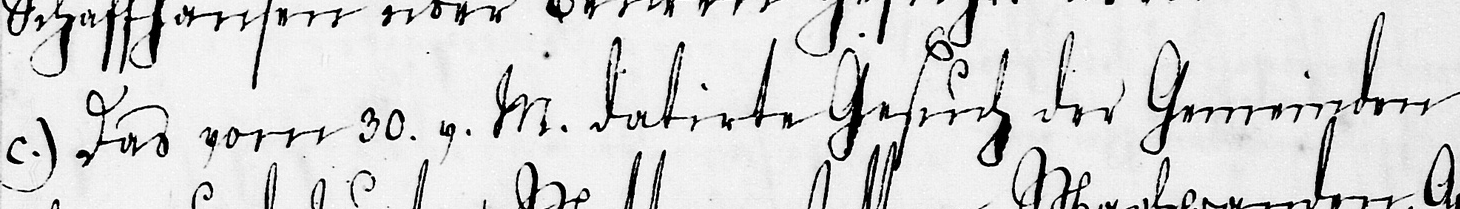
c.) Das vom 30. v. M. datirte Gesuch der Gemeinden
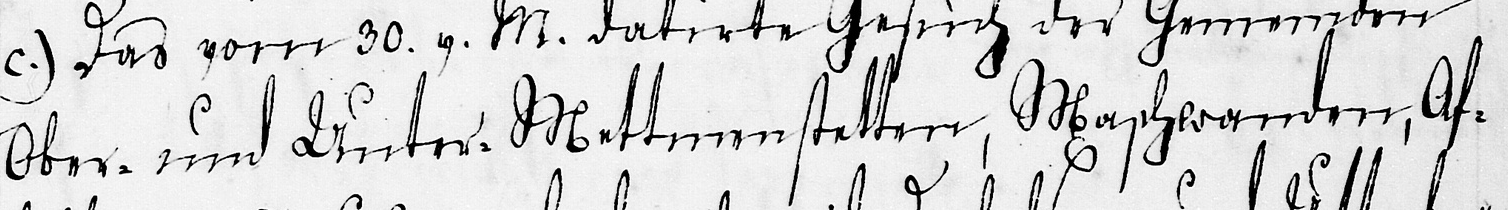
Ober- und Unter-Mettmenstetten, Maschwanden, Af¬
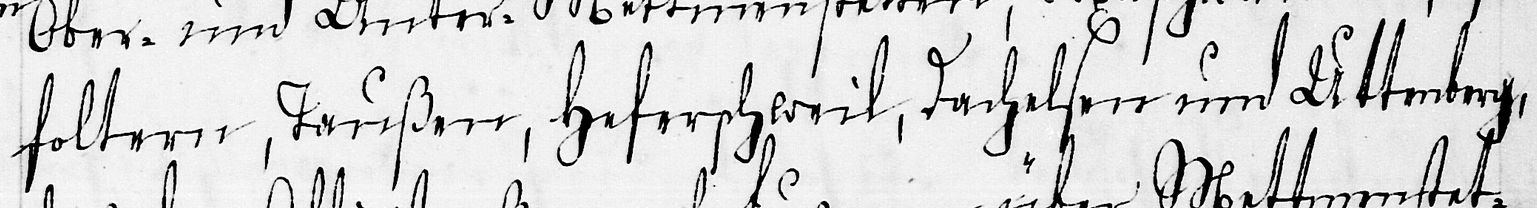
foltern, Taußen, Heferschweil, Dachelsen und Uttenberg,
